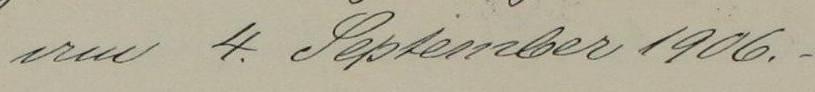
am 4. September 1906.
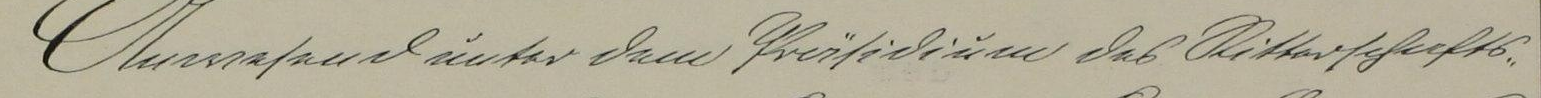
Anwesend unter dem Präsidium des Ritterschafts-
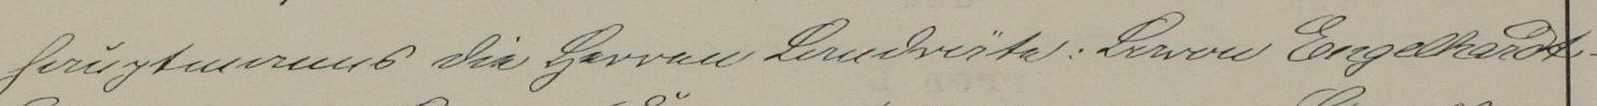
hauptmanns die Herren Landräte: Baron Engelhardt-
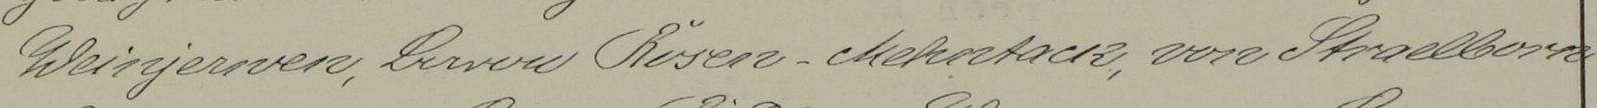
Weinjerwen, Baron Rosen-Mehntack, von Straelborn-
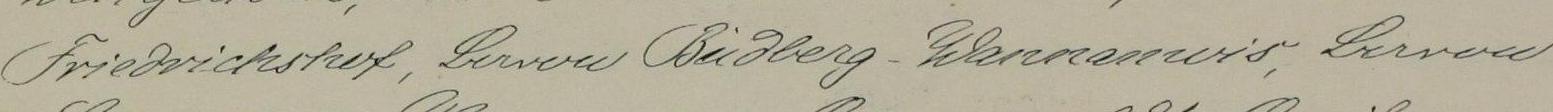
Friedrichshof, Baron Budberg-Wannamois, Baron
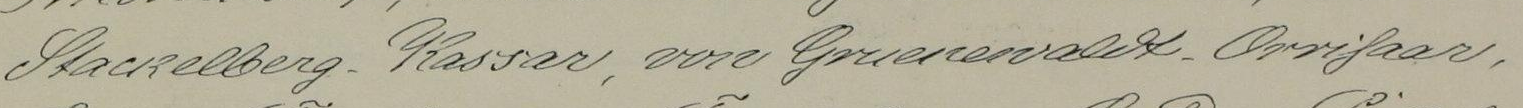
Stackelberg-Kassar, von Gruenewaldt-Orrisaar,
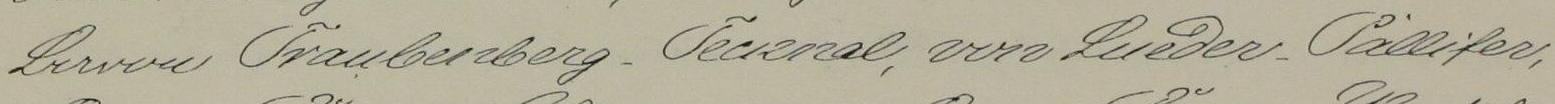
Baron Traubenberg-Tecknal, von Lueder-Pallifer,
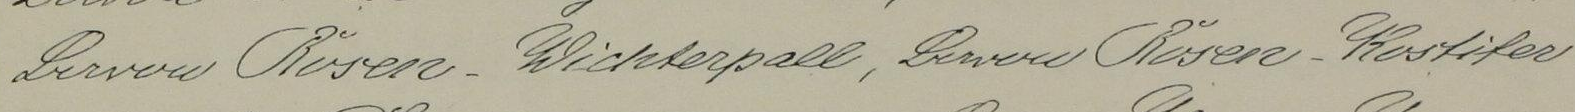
Baron Rosen-Wichterpall, Baron Rosen-Kostifer
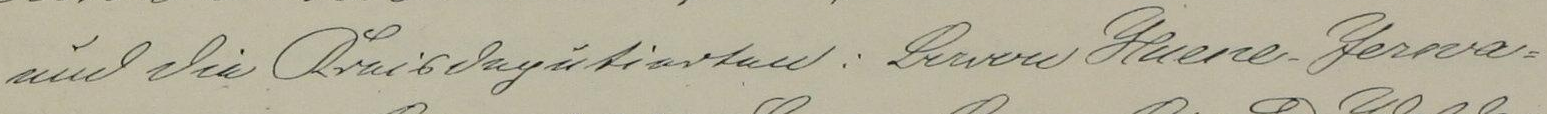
und die Kreisdeputierten: Baron Huene-Jerwa-
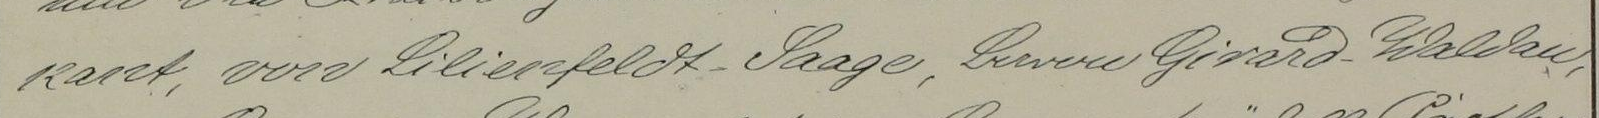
kant, von Lilienfeldt-Saage, Baron Girard-Waldau,
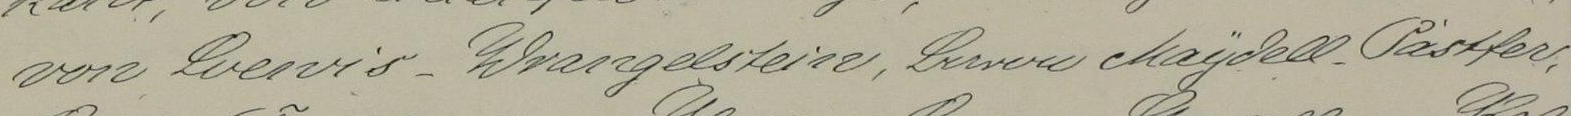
von Loewis-Wrangelstein, Baron Maydell-Pastfer,
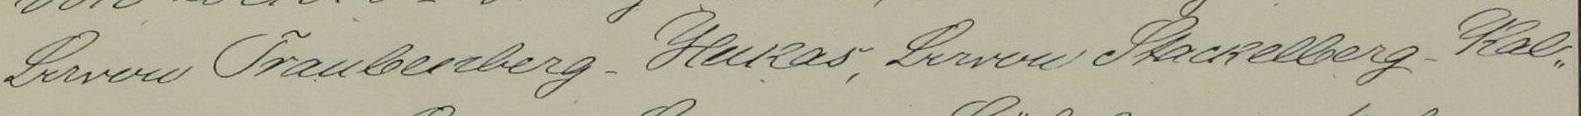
Baron Traubenberg-Hukas, Baron Stackelberg-Kal-
